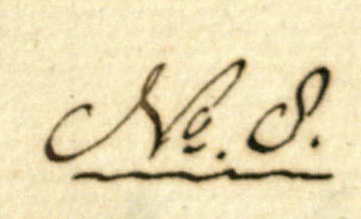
No 8.
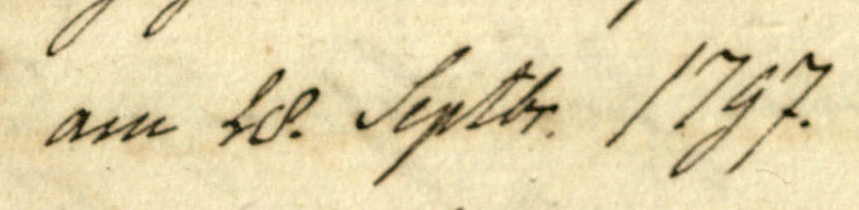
am 28. Septbr. 1797.
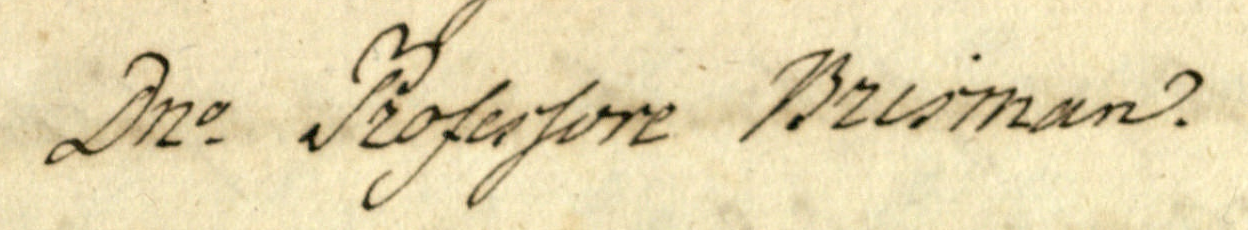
Dno Professore Brisman.
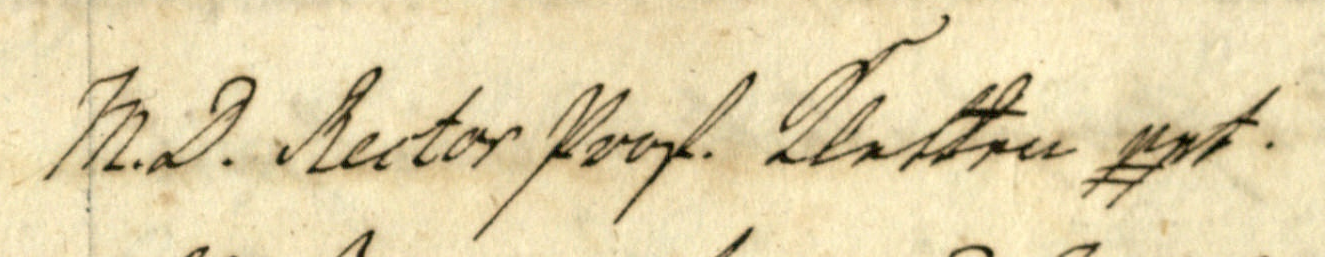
M. D. Rector Prof. Kletten ppt.
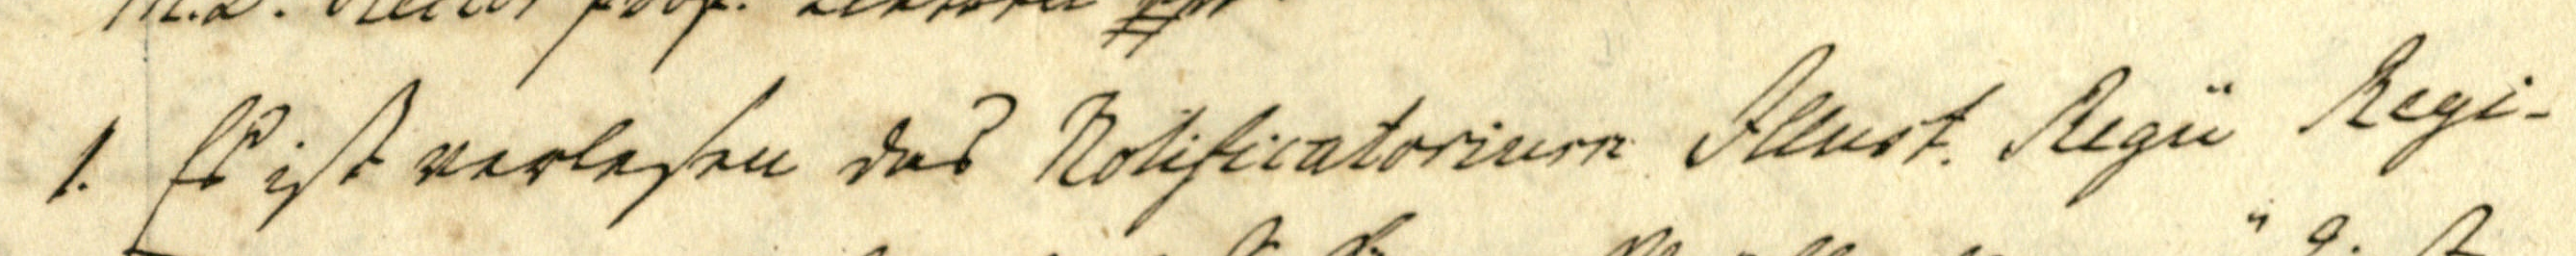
1. Es ist verlesen das Notificatorium Illust. Regii Regi¬
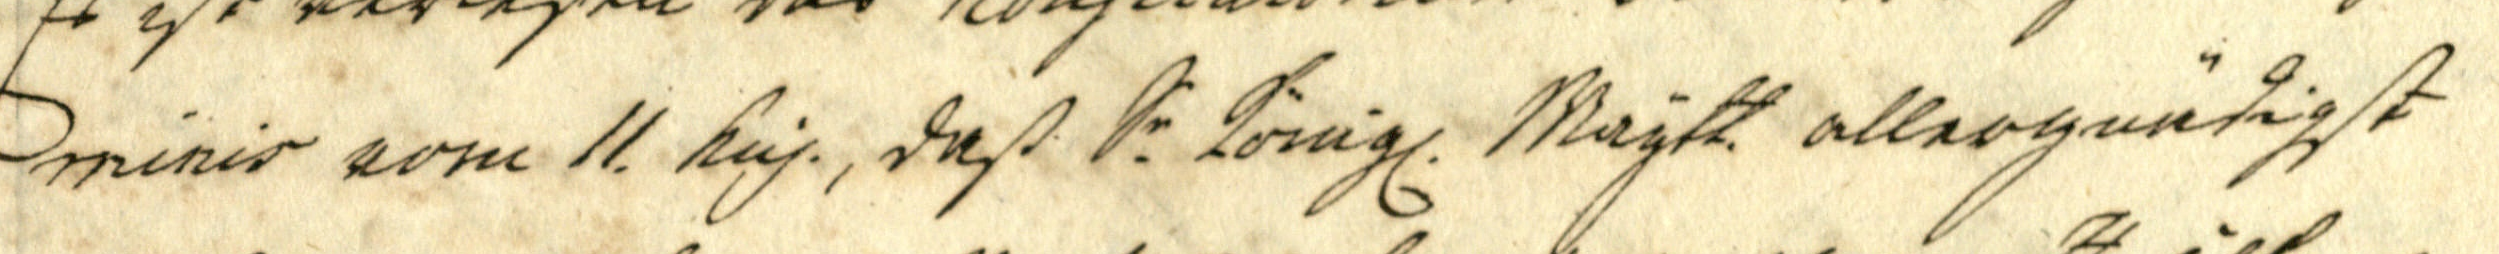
minis vom 11. huj., daß Sr. Königl. Maÿtt. allergnädigst
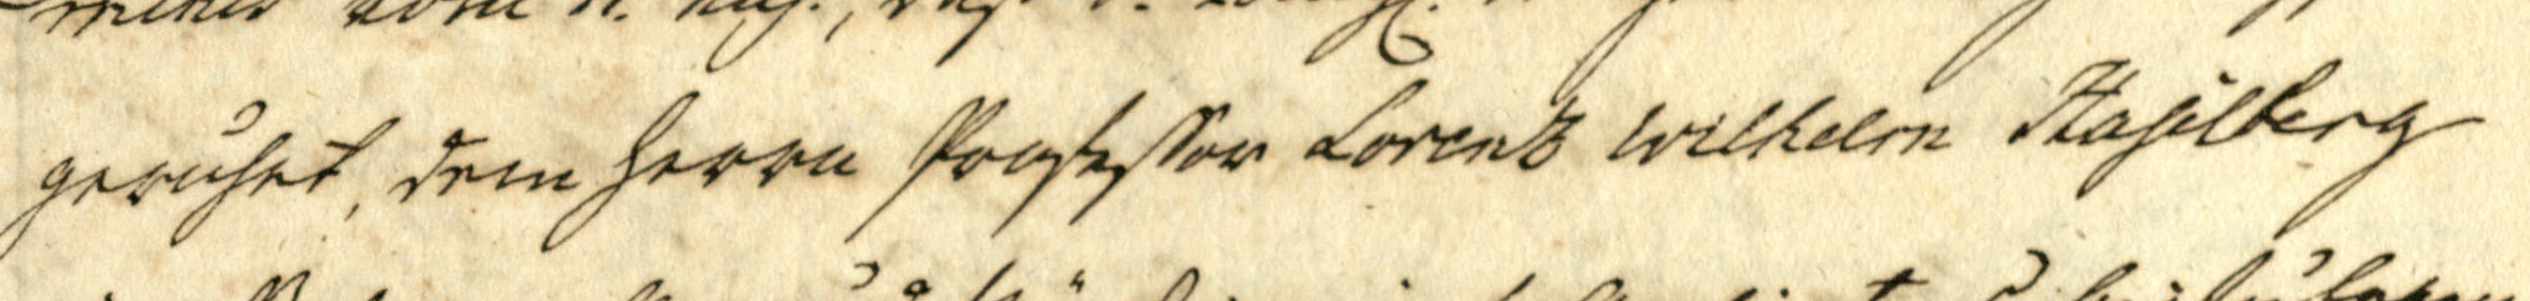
geruhet, dem Herrn Professor Lorenz Wilhelm Haselberg
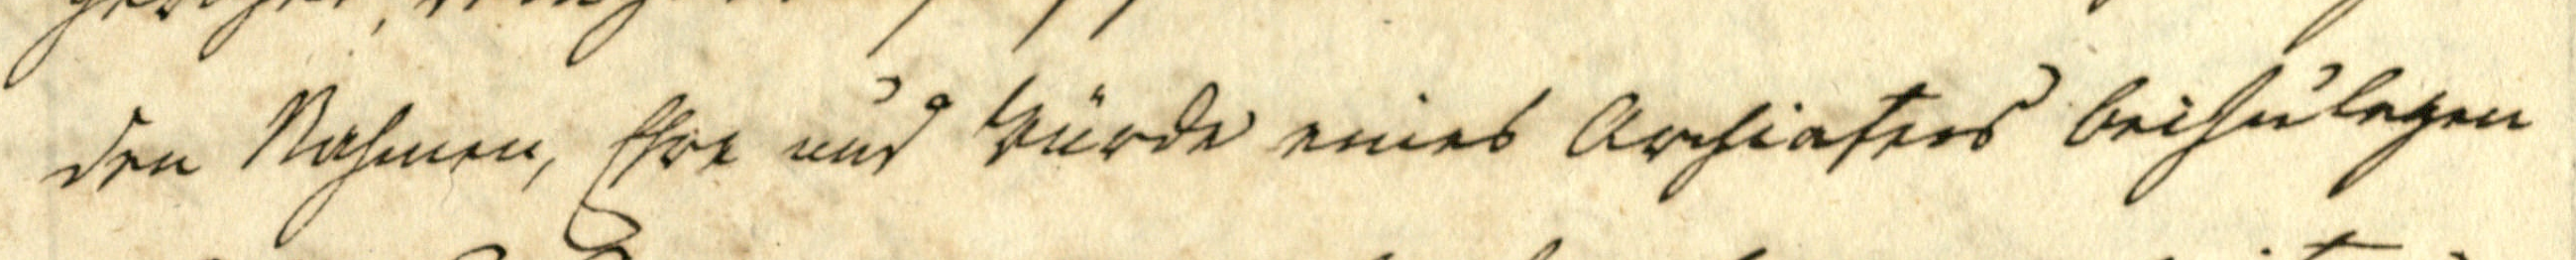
den Nahnen, Ehre und Würde eines Archiaters beizulegen
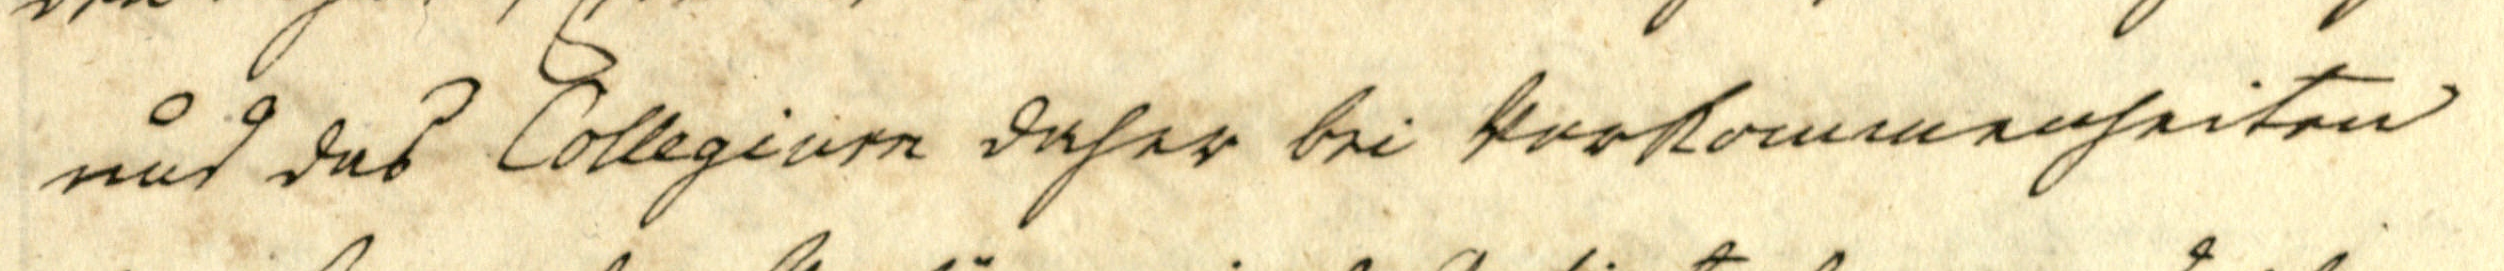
und das Collegium daher bei Vorkommenheiten
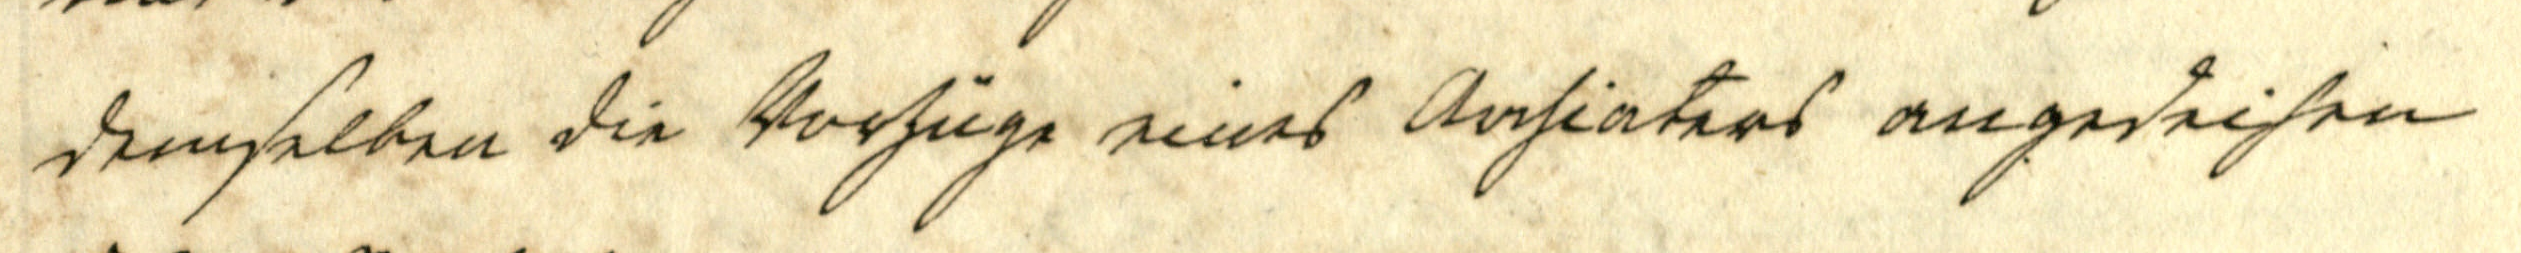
demselben die Vorzüge eines Archiaters angedeihen
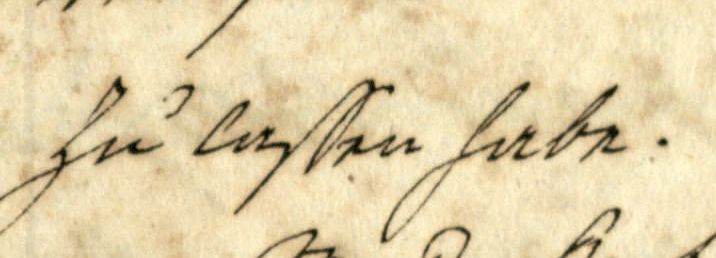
zu lassen habe.
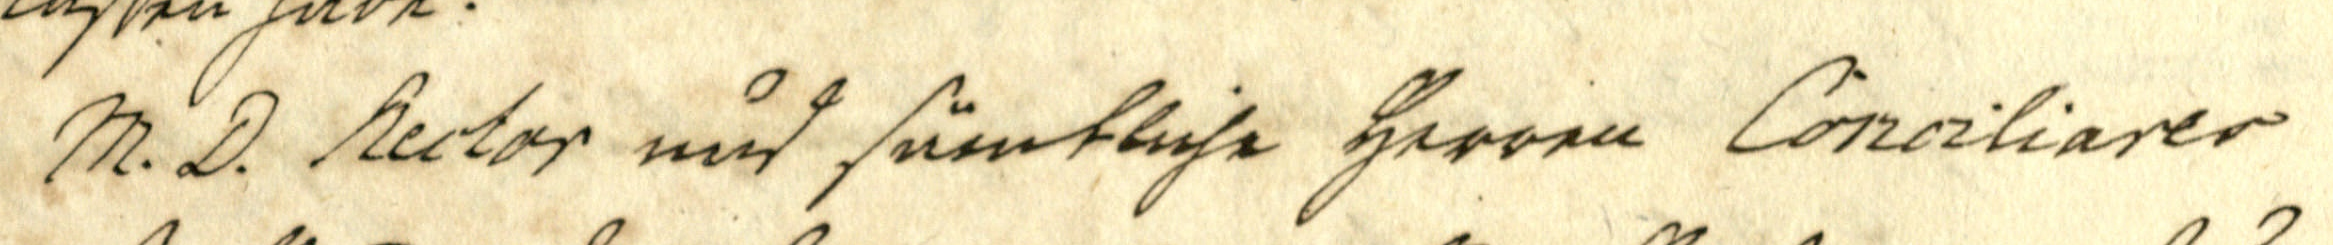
M. D. Rector und sämtliche Herren Conciliares
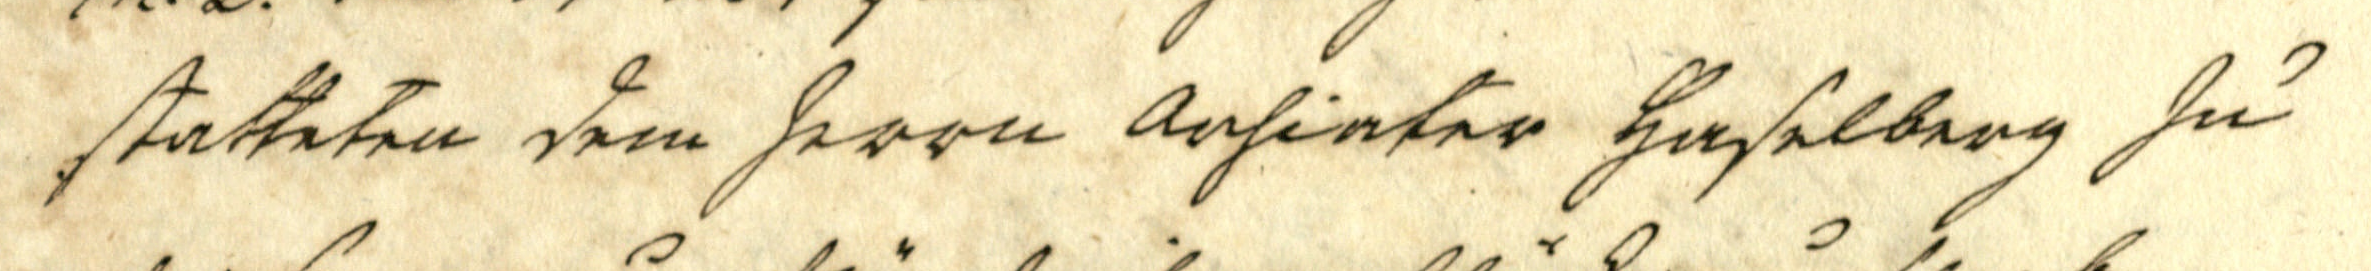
statteten dem Herrn Archiater Haselberg zu
